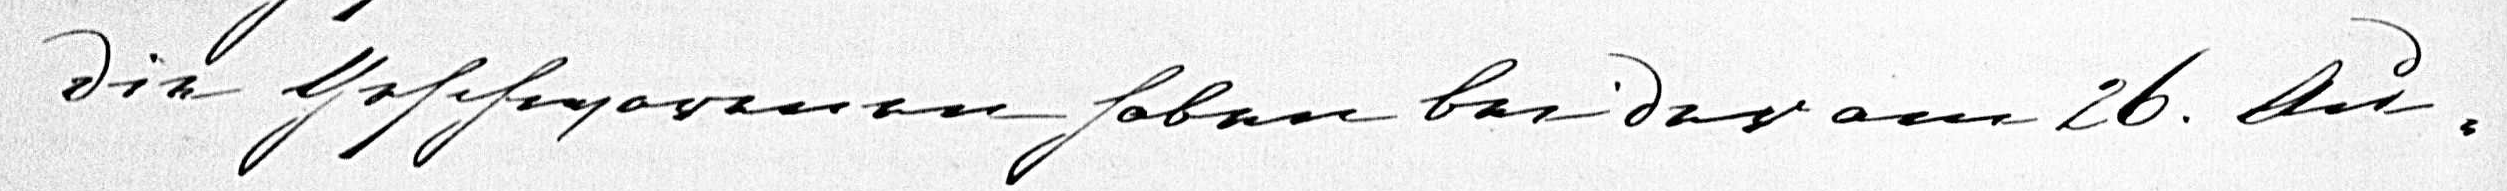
Die Geschworenen haben bei der am 26. Au¬
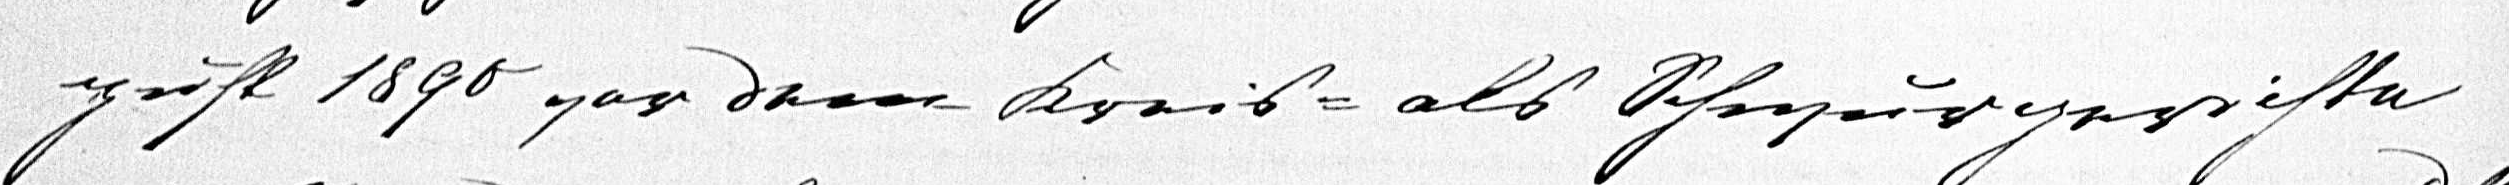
gust 1890 vor dem Kreis= als Schwurgerichte
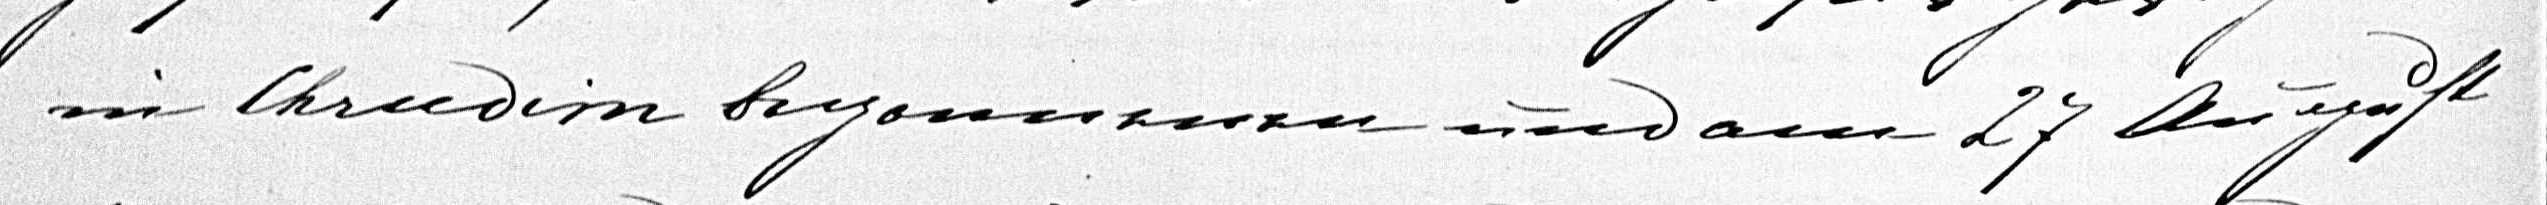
in Chrudim begonnenen und am 27 August
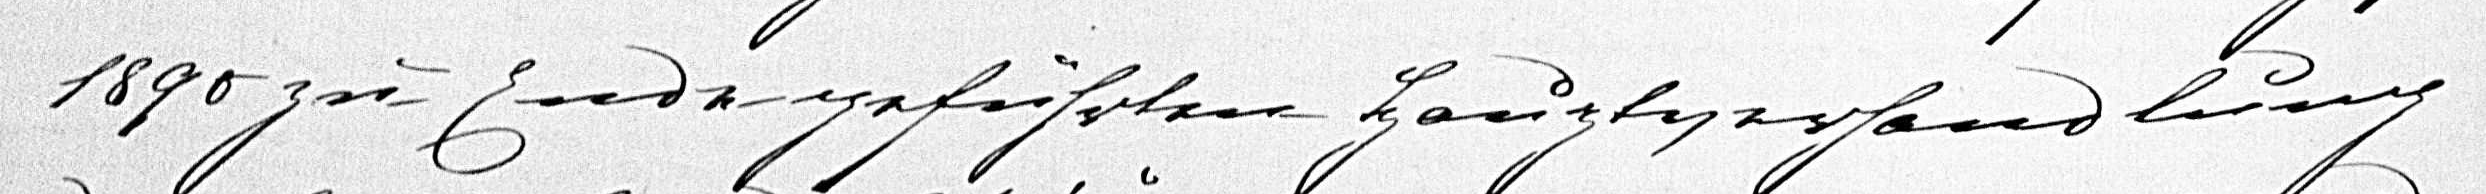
1890 zu Ende geführten Hauptverhandlung
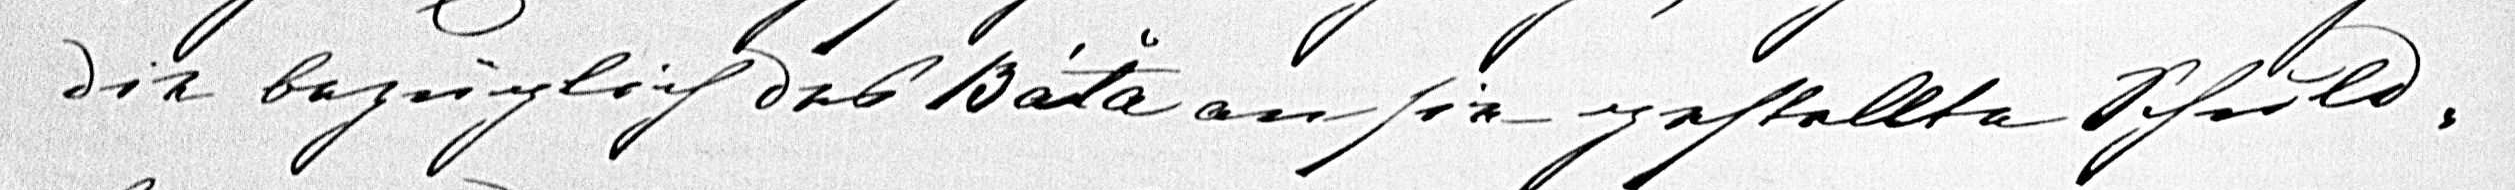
die bezüglich des Báta an sie gestellte Schuld¬
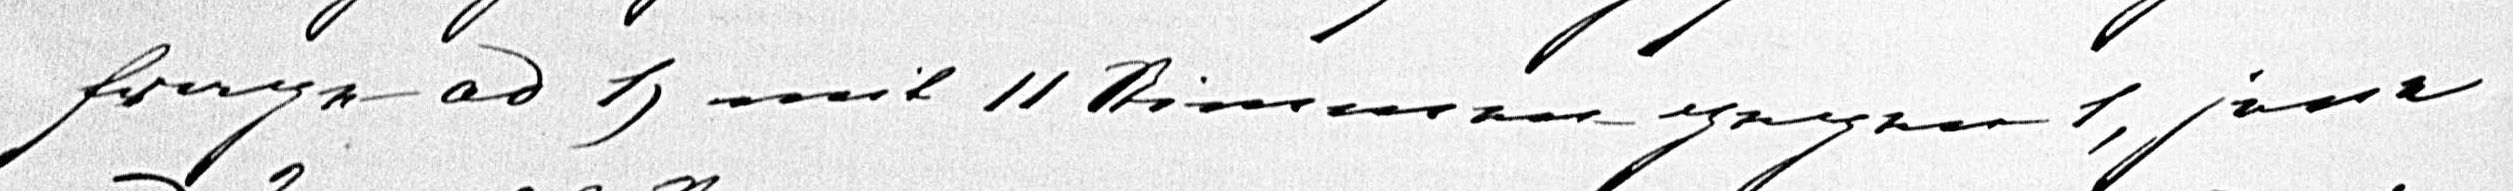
frage ad 1) mit 11 Stimmen gegen 1, jene
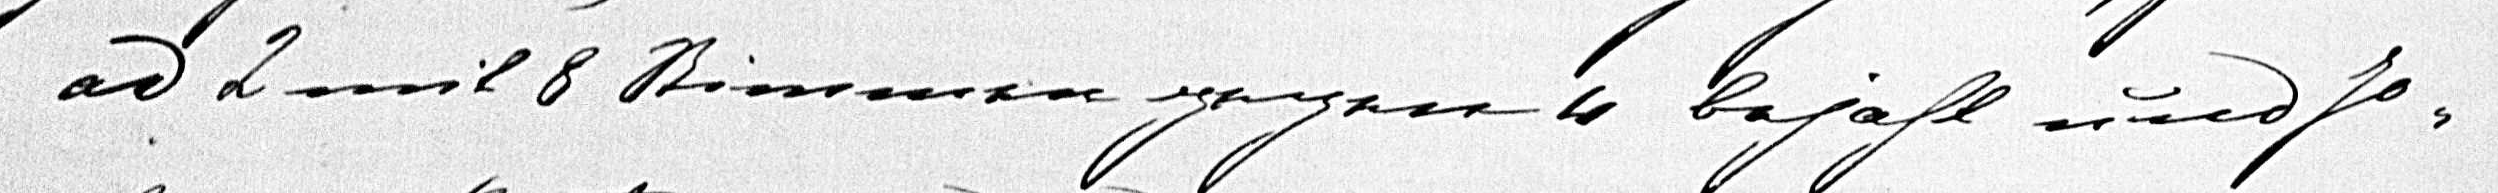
ad 2 mit 8 Stimmen gegen 4 bejaht und Jo¬
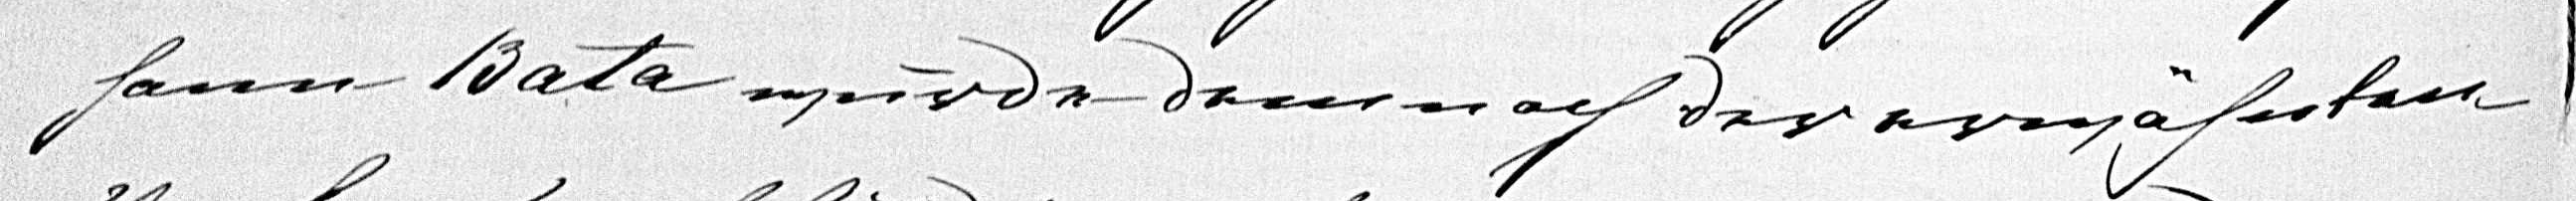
hann Bata wurde dem nach der erwähnten
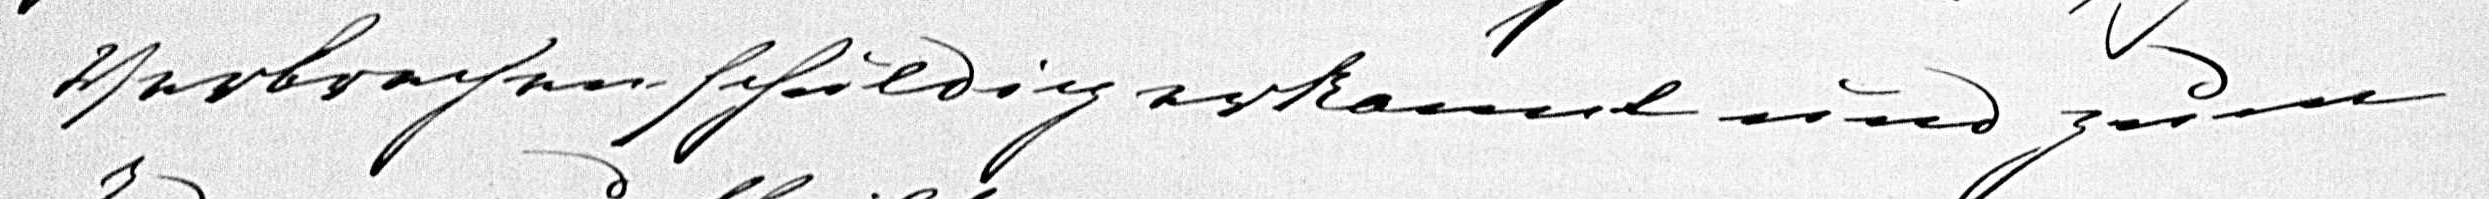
Verbrechen schuldig erkannt und zum
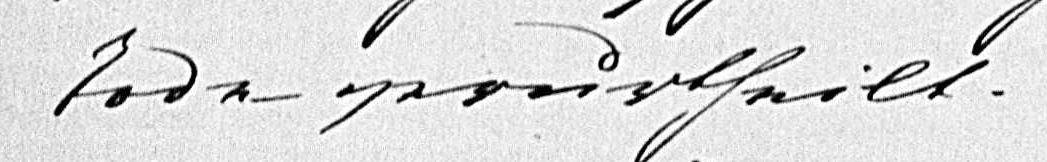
Tode verurtheilt.
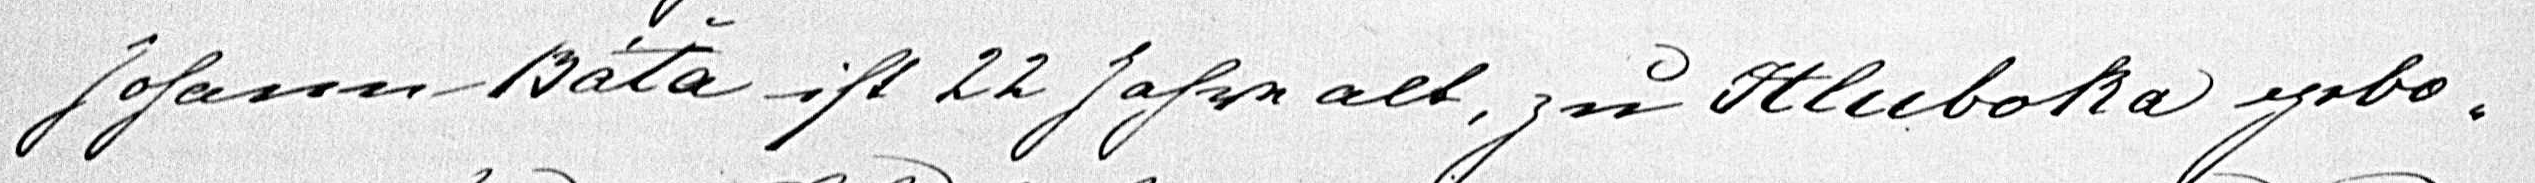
Johann Báta ist 22 Jahre alt, zu Hluboka gebo¬
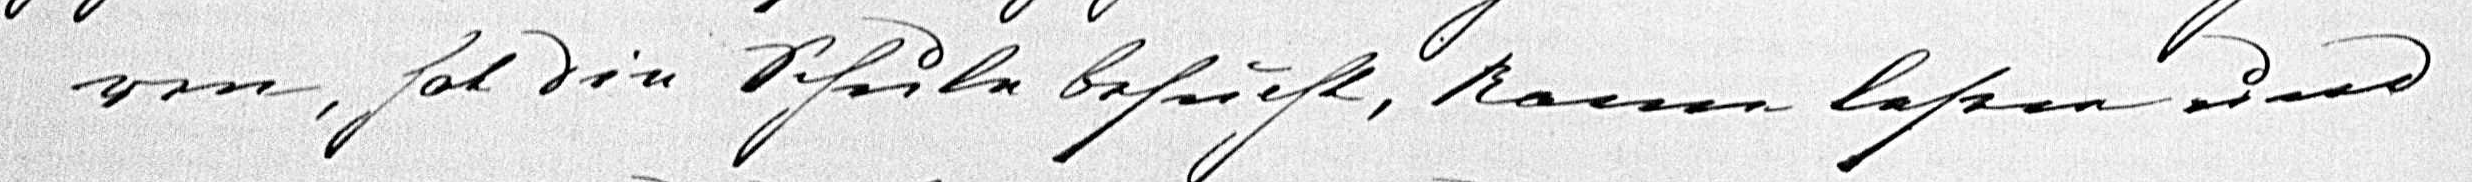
ren, hat die Schule besucht, kann lesen und
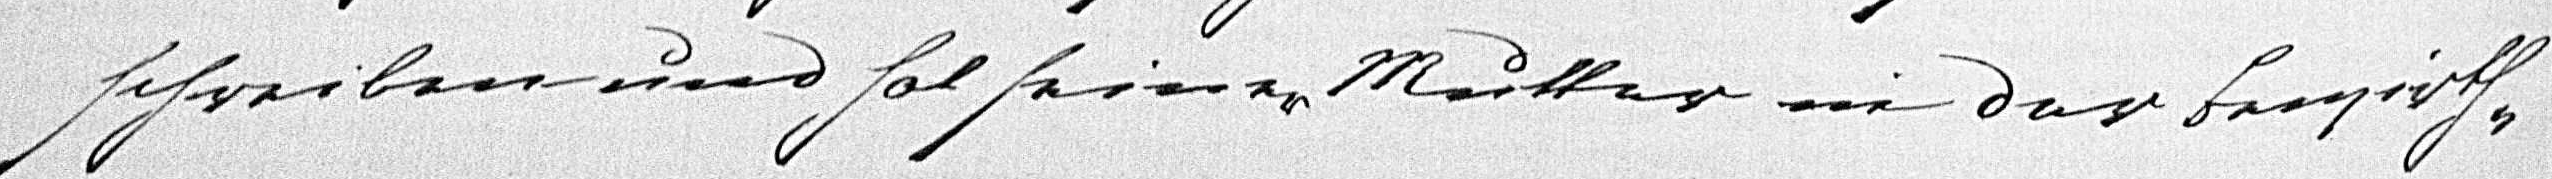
schreiben und hat seiner Mutter in der Bewirth¬
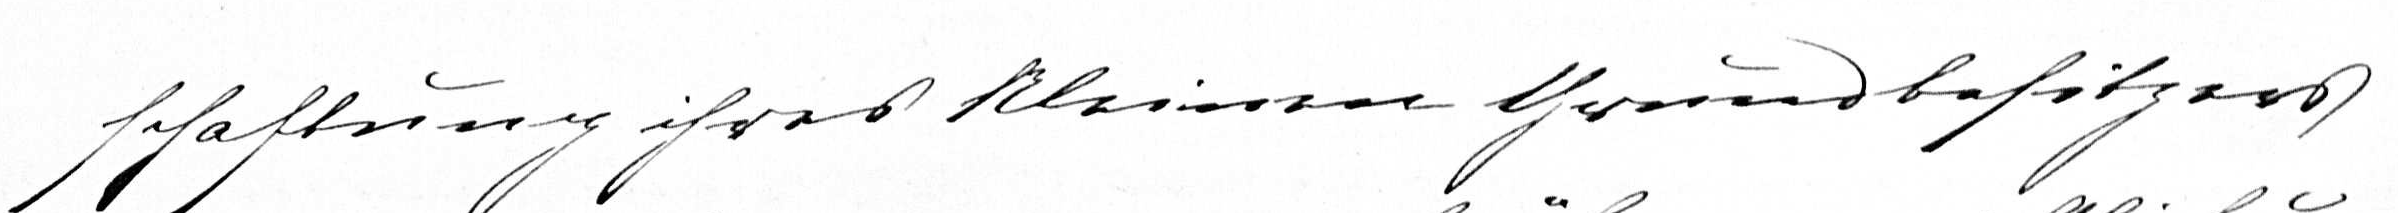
schaftung ihres kleinen Grundbesitzers
